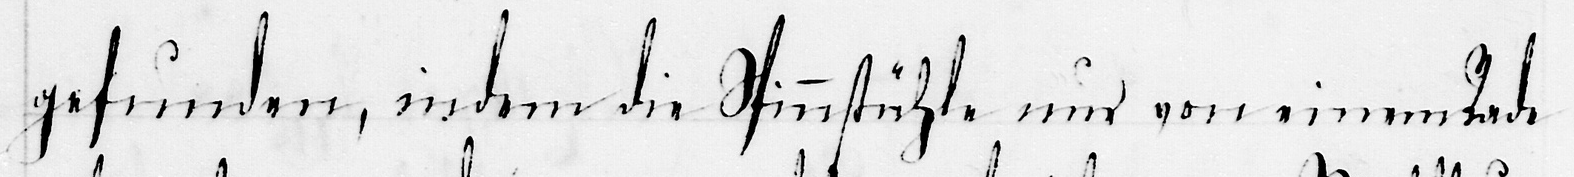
gefunden, indem die Spinnstühle nur von einem Rade
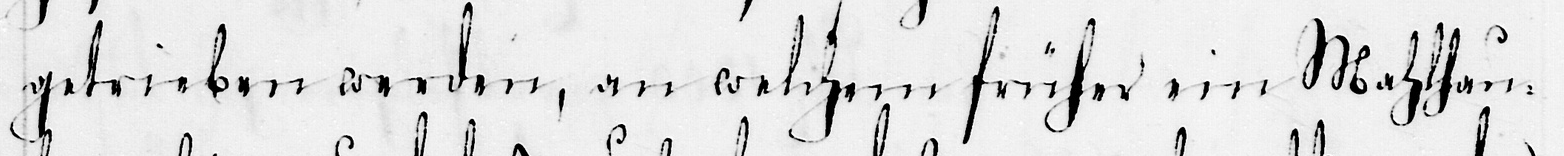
getrieben werden, an welchem früher ein Mahlhau¬
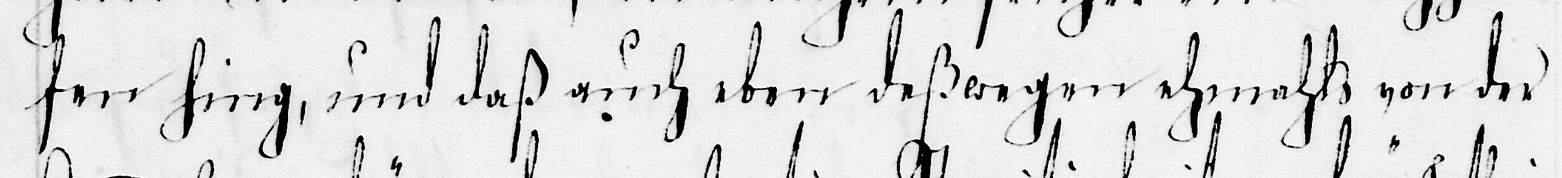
fen hing, und daß auch eben deßwegen ehmahls von der
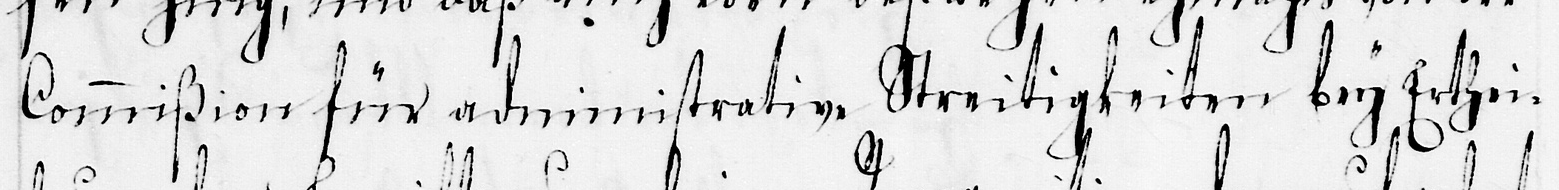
Commißion für administrative Streitigkeiten bey Erthei¬
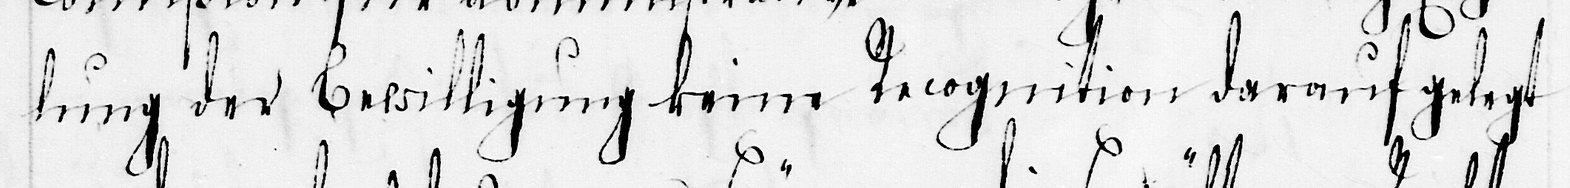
lung der Bewilligung keine Recognition darauf gelegt
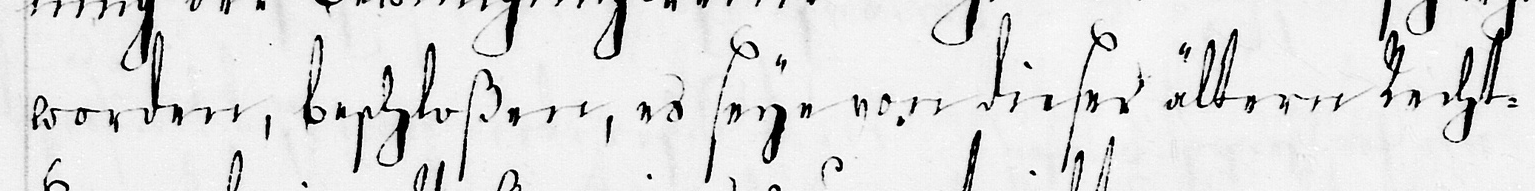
worden, beschloßen, es seye von dieser ältern Recht¬
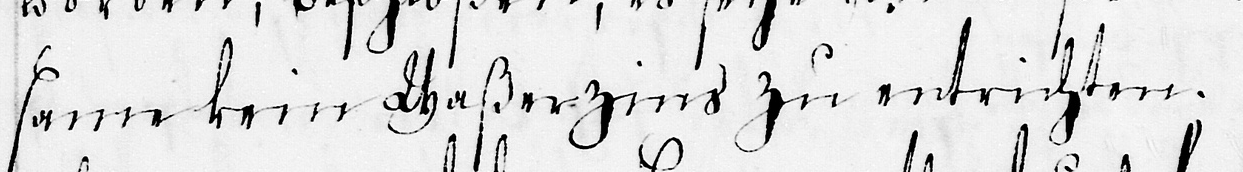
same kein Waßerzins zu entrichten.
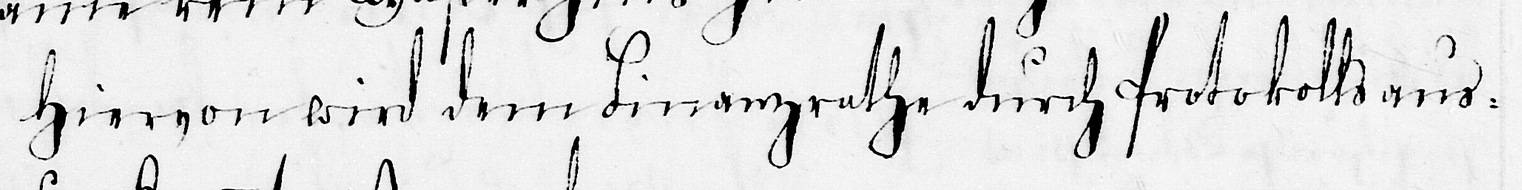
Hiervon wird dem Finanzrathe durch Protokollsaus¬
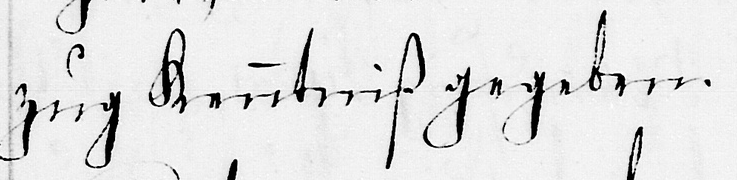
zug Kenntniß gegeben.
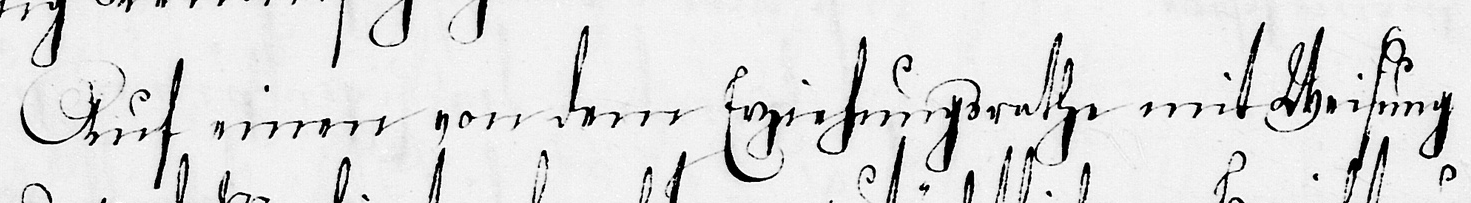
Auf einen von dem Erziehungsrathe mit Weisung
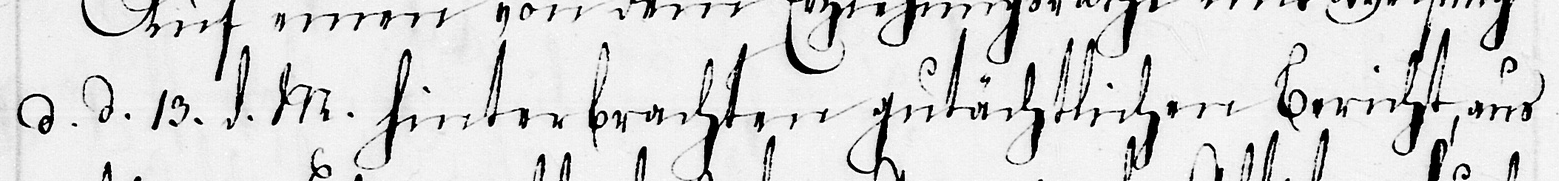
d. d. 13. d. M. hinterbrachten gutächtlichen Bericht, aus
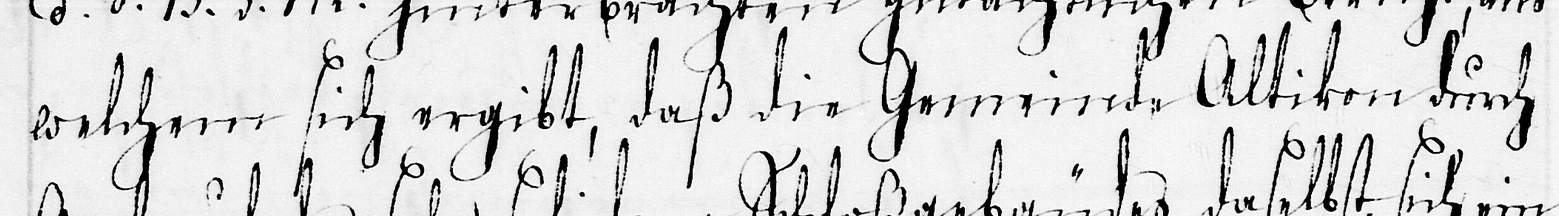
welchem sich ergibt, daß die Gemeinde Altikon durch
